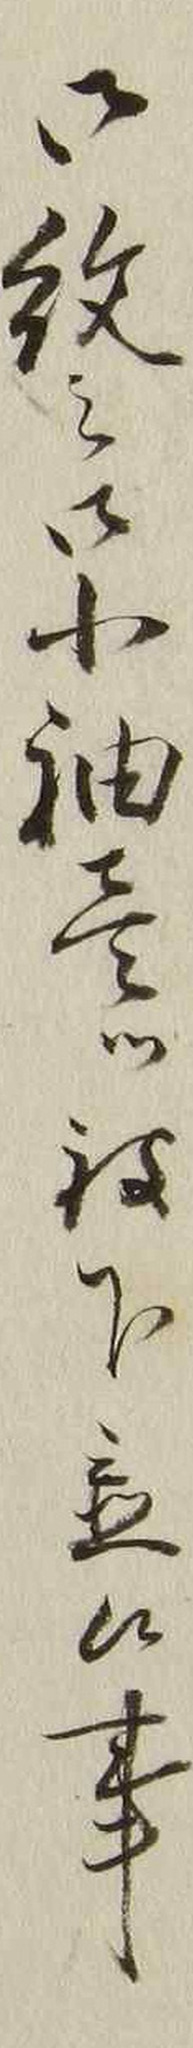御紋之御小袖壱ッ被下置候事
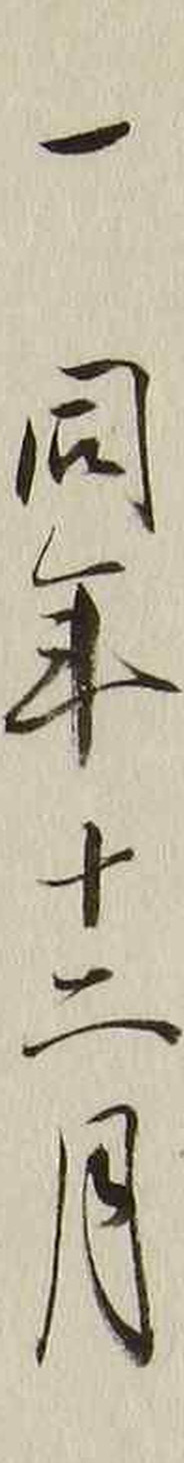一同年十二月
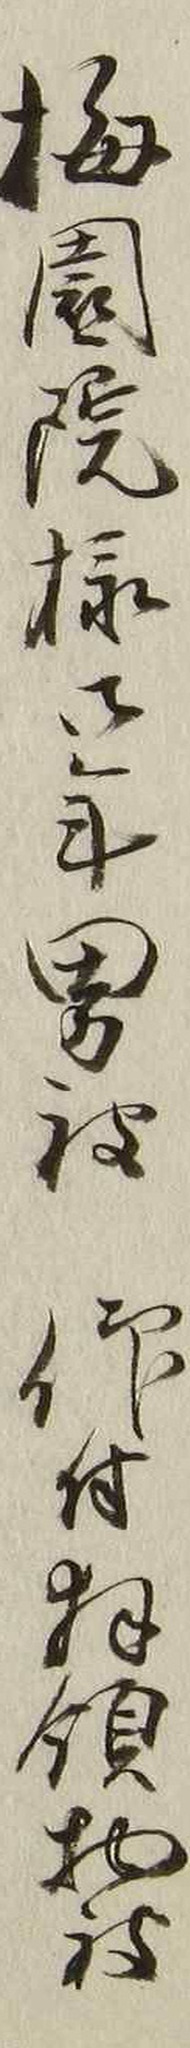梅園院様御年男被仰付拝領物被
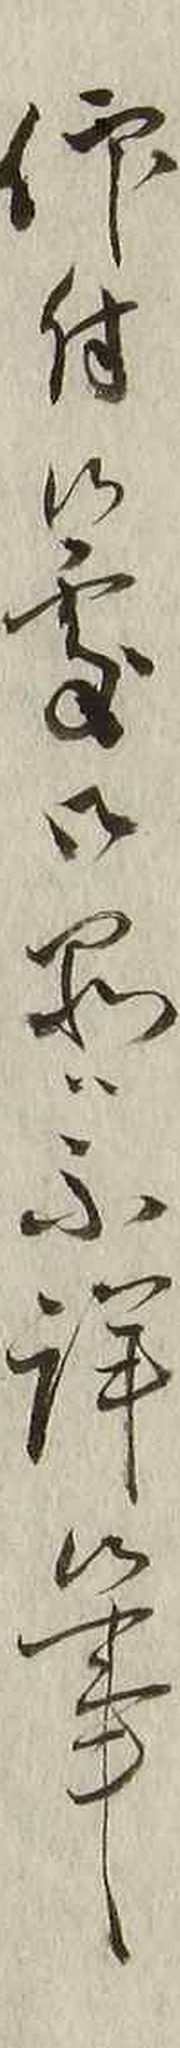仰付候処御品は不詳候事
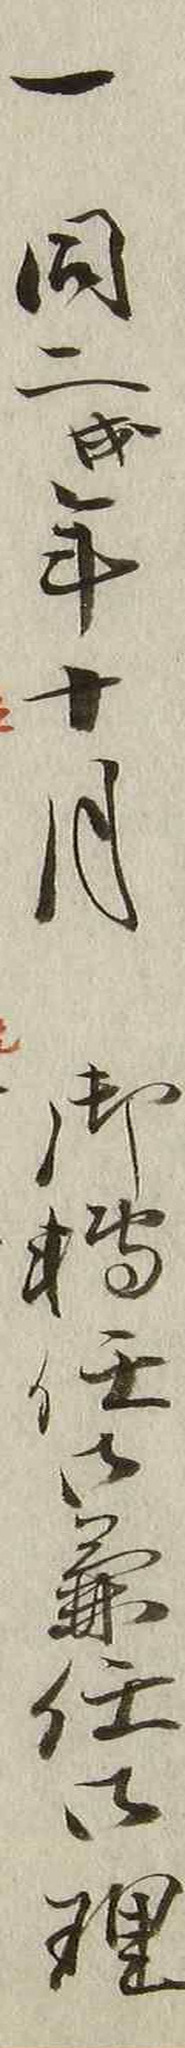一同二戌年十月御転任御兼任御理
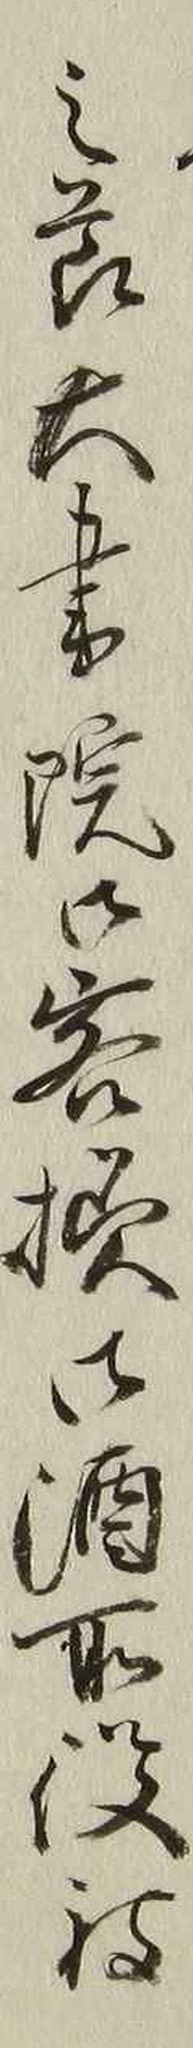之節大書院御客様御酒取役被
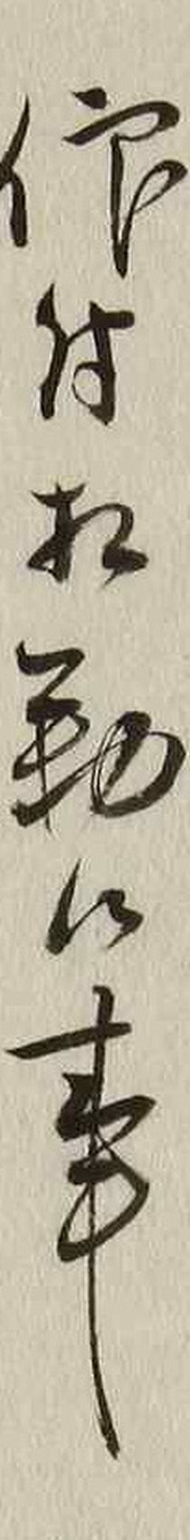仰付相勤候事
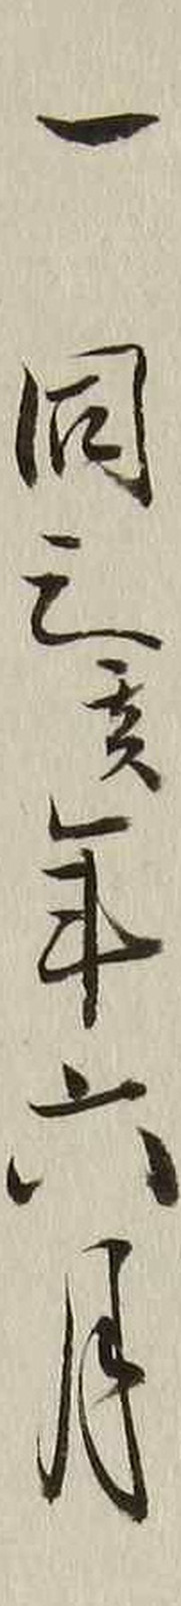一同三亥年六月
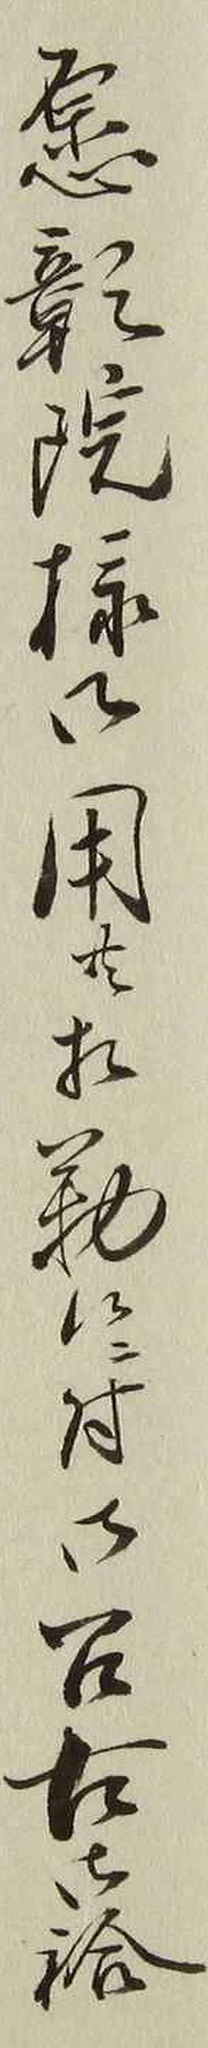一愿彰院様御用共相勤候ニ付御召古御袷
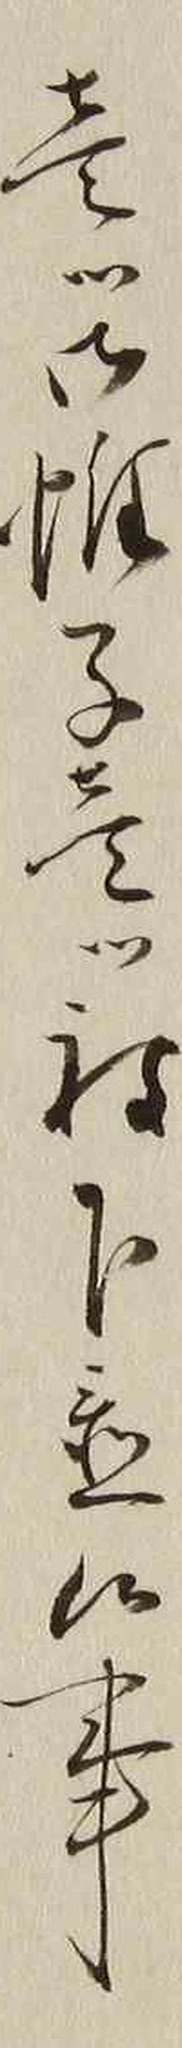壱ッ御帷子壱ッ被下置候事
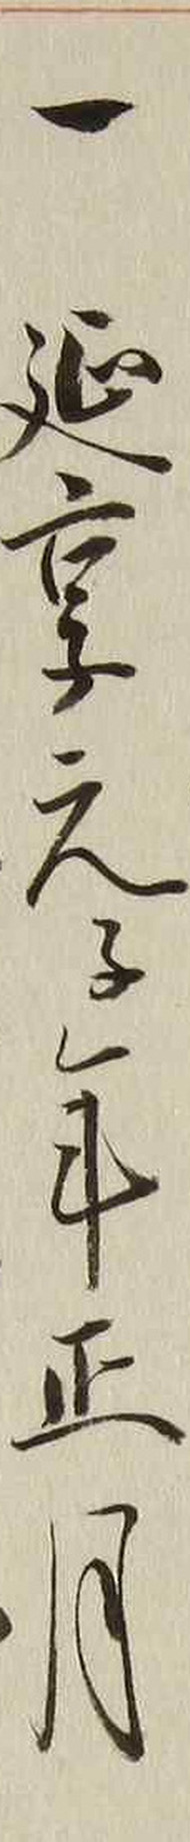一延享元子年正月
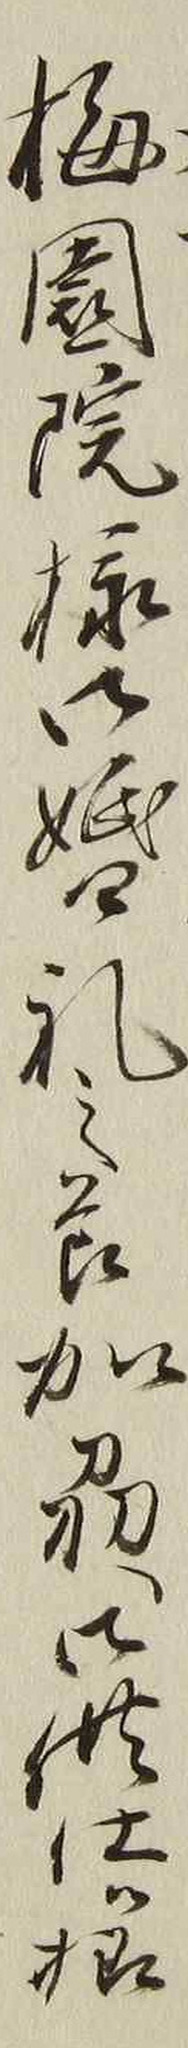梅園院様御婚礼之節加州ㇸ御供仕候様
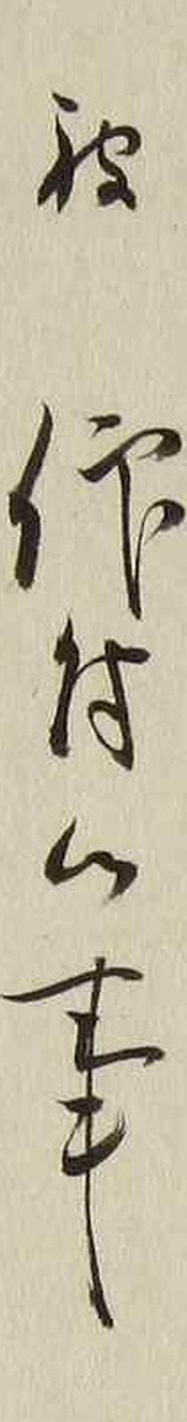被仰付候事
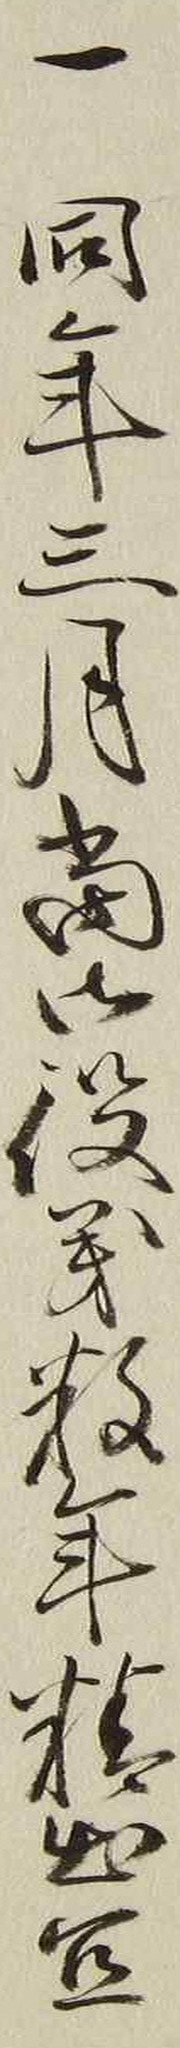一同年三月当御役義数年精出宜
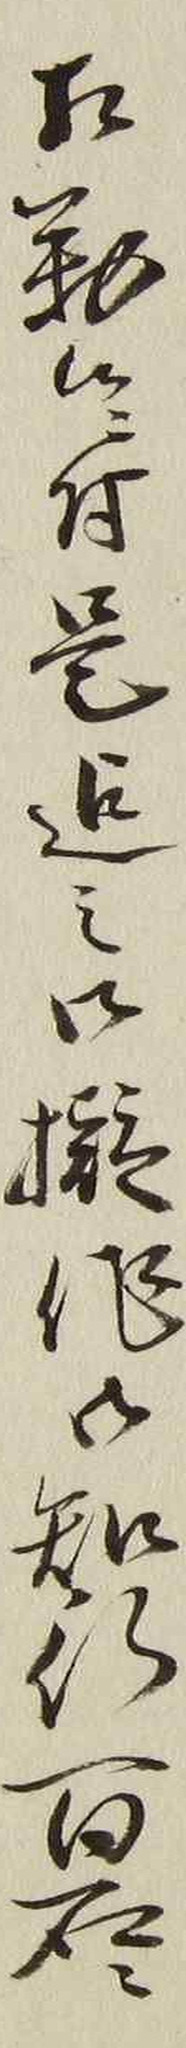相勤候ニ付是迄之御擬作御知行百石ニ
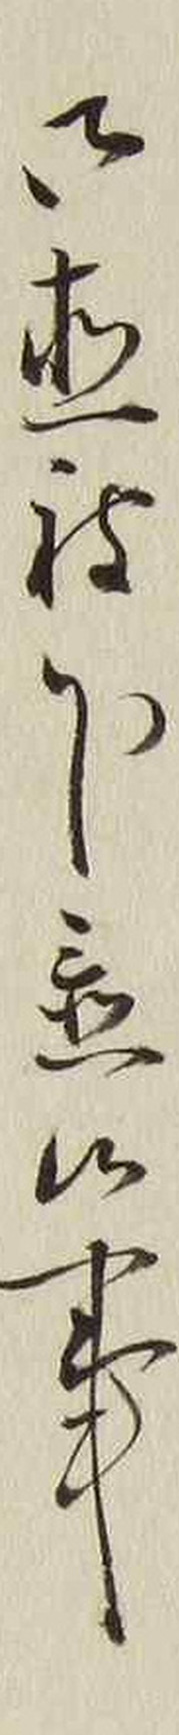御直被下置候事
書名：諸士系譜　巻之163　な之部5
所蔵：会津若松市立会津図書館
